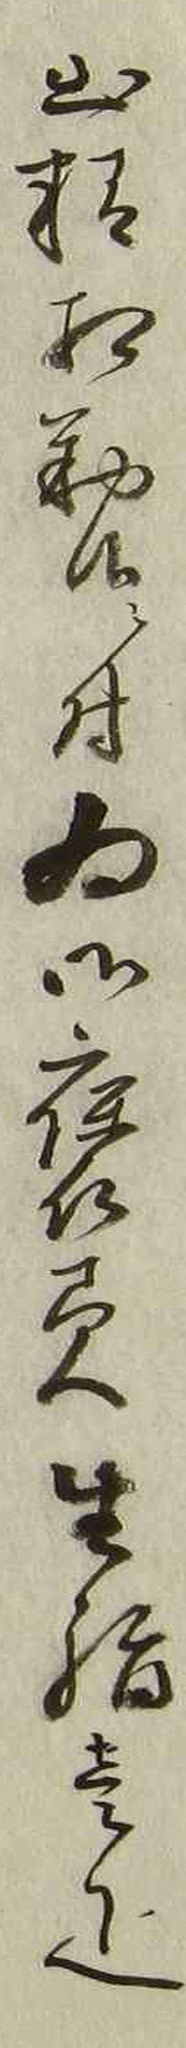出精相勤候ニ付為御褒美生絹壱疋
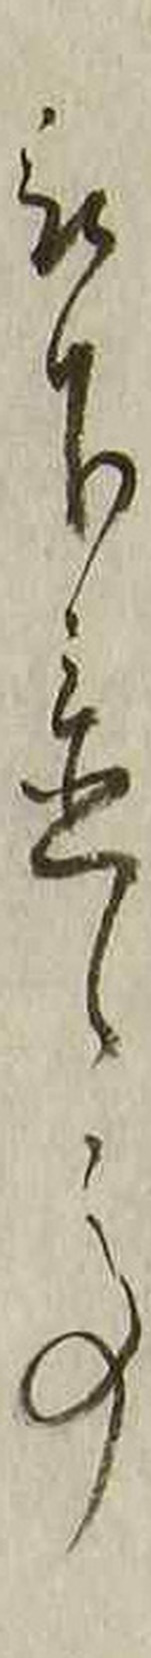被下置候事
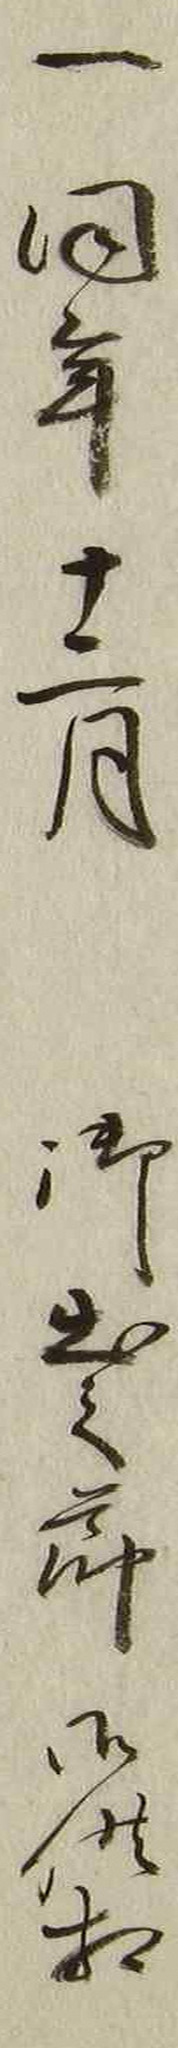一同年十二月御出之節御供相
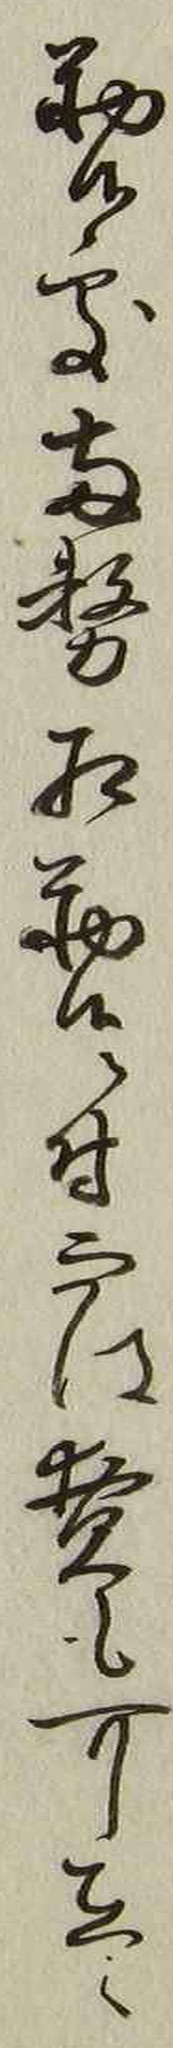勤候処両務相勤候ニ付而は費も可在之
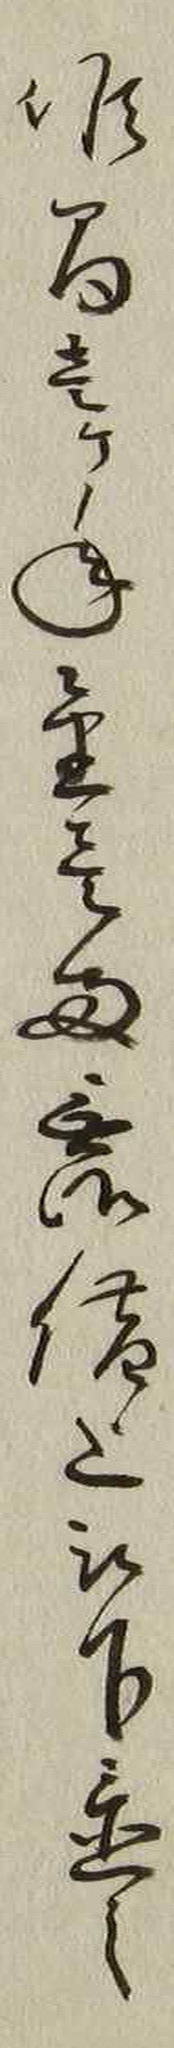候間壱ケ年金壱両無御借上被下置之
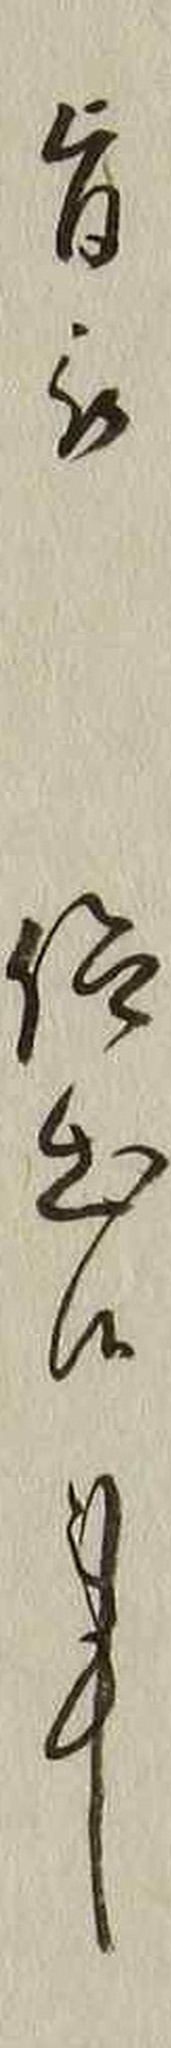旨被仰出候事
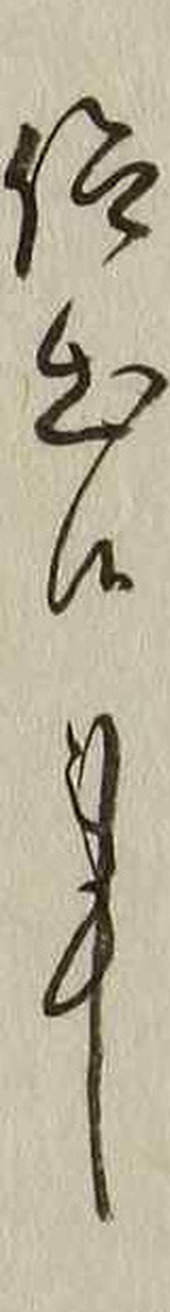仰付候事
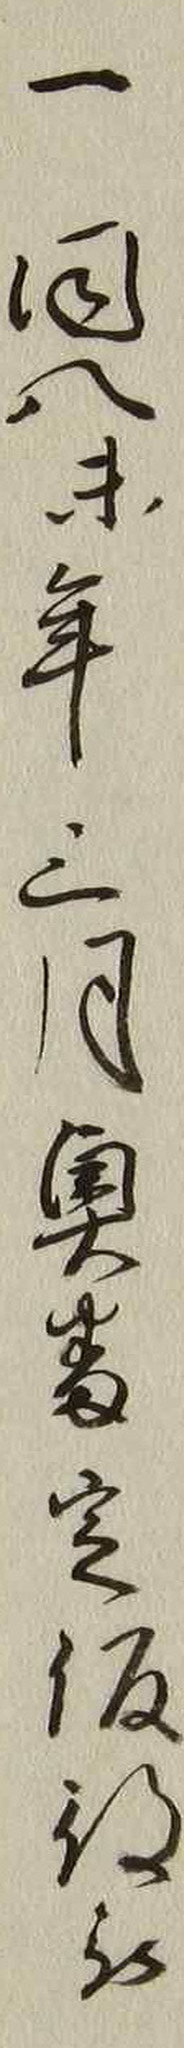一同八未年三月奥番定仮役被
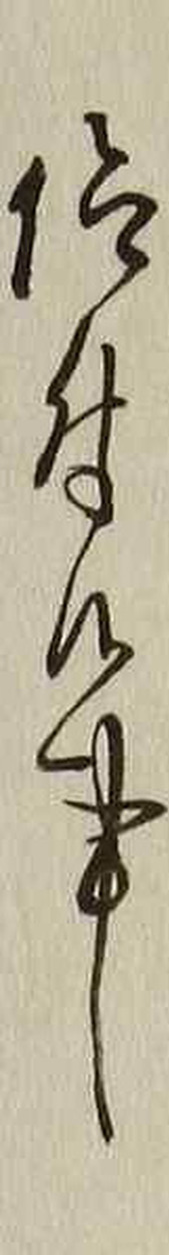仰付候事
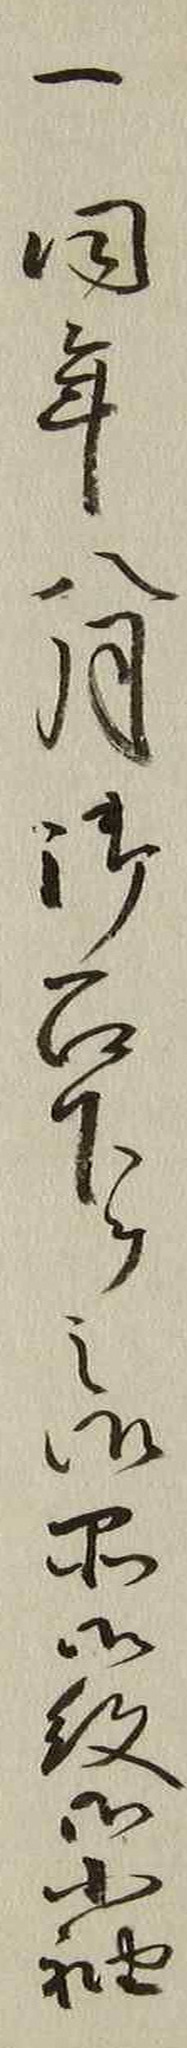一同年八月御召下ケ之御品御紋御小袖
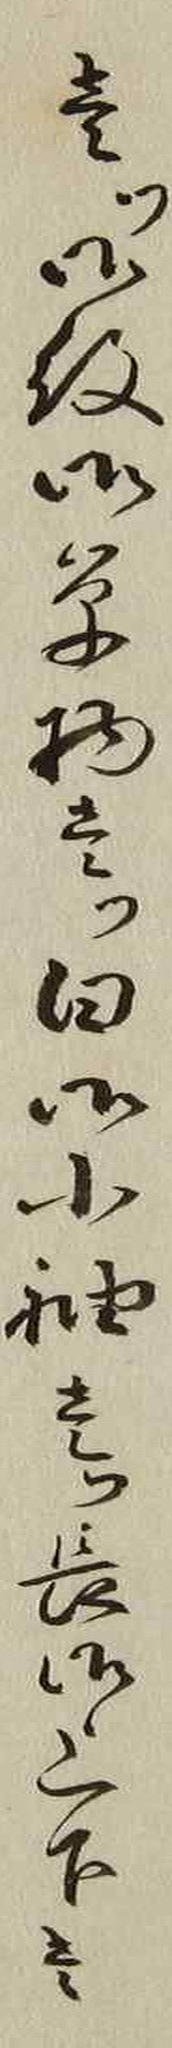壱ツ御紋御単物壱ツ白御小袖壱ツ長御上下壱
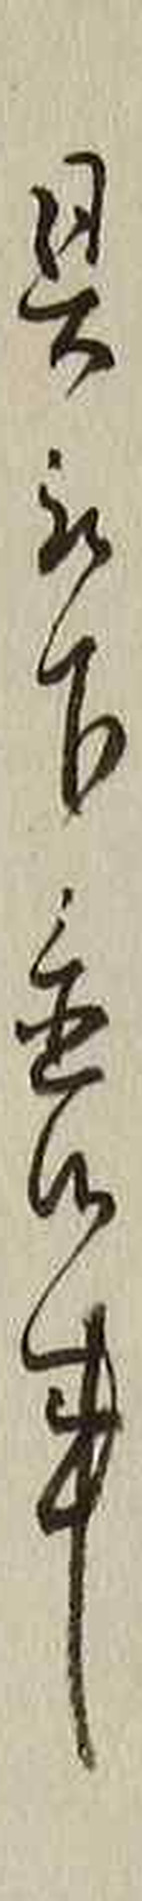具被下置候事
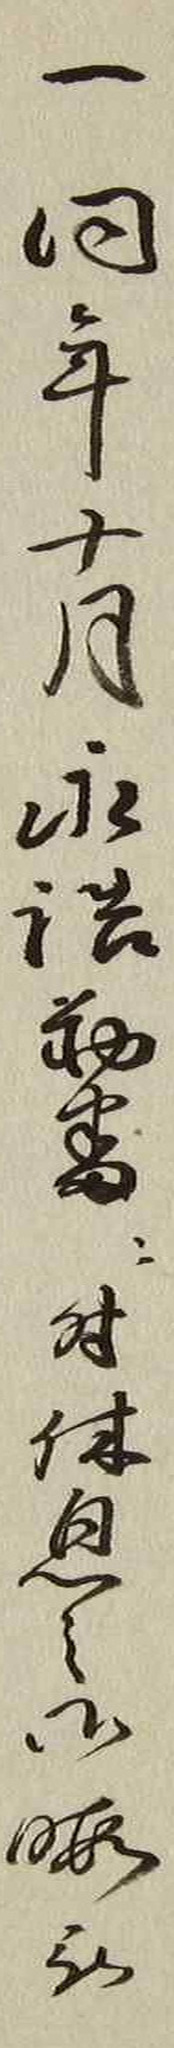一同年十月永詰勤番ニ付休息之御暇被
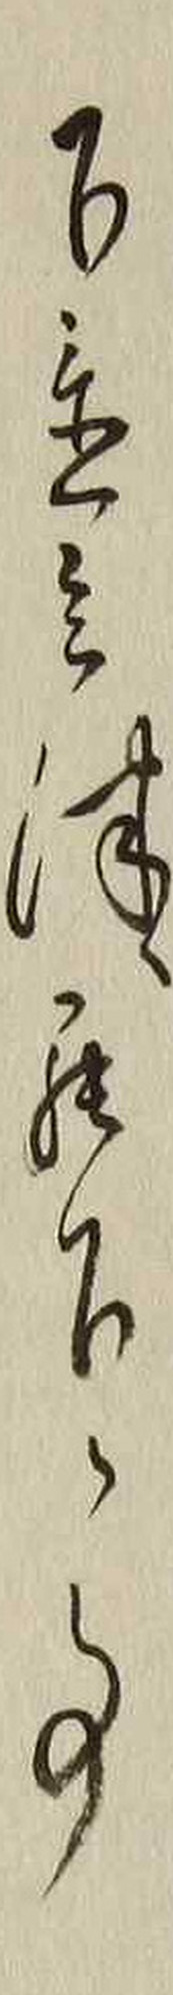下置会津へ罷下候事
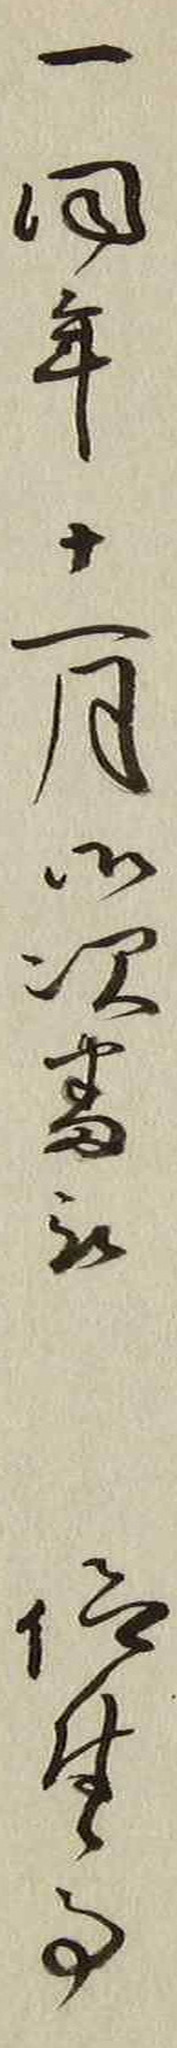一同年十一月御次番被仰付候事
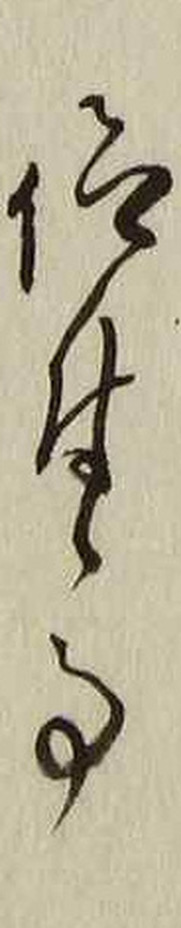仰付候事
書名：諸士系譜　巻之4　い之部4
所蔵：会津若松市立会津図書館
